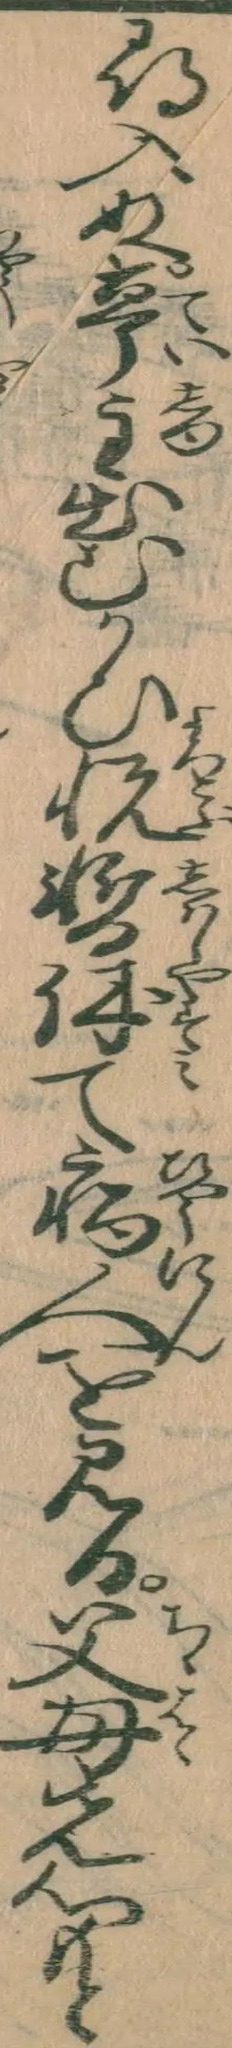尋入ぬ。亭主出むかひ悦暫休て病人を見る。父母先心もと
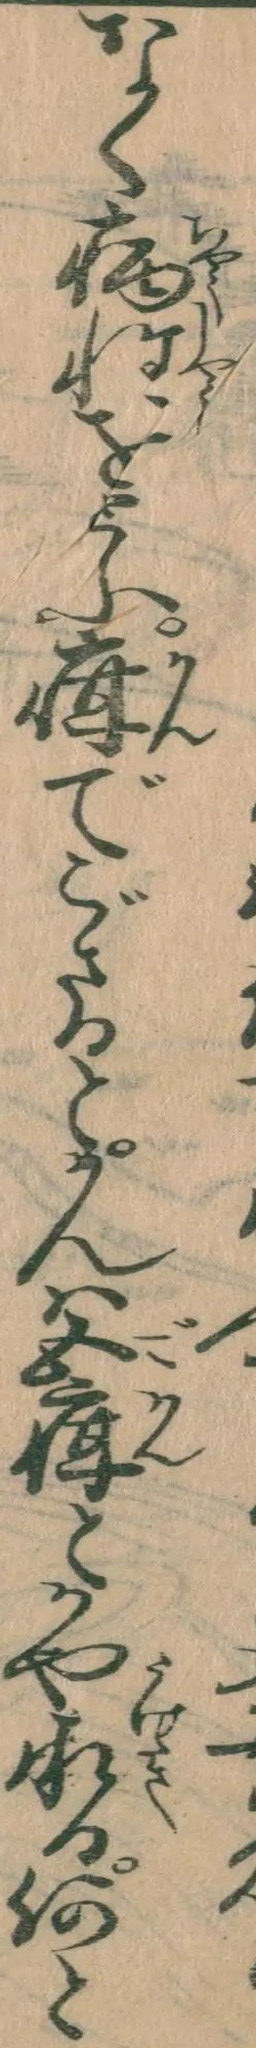なく病性をとふ。疳でごさると。かんは五疳とかや承る。何と
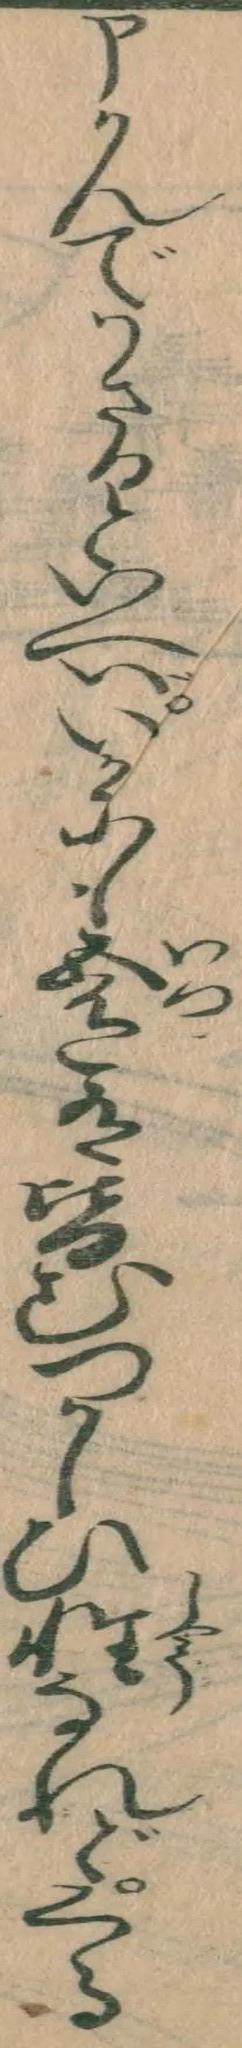申かんでかさるといへば。いかにも五色有皆むつかしひ性なれど。くる
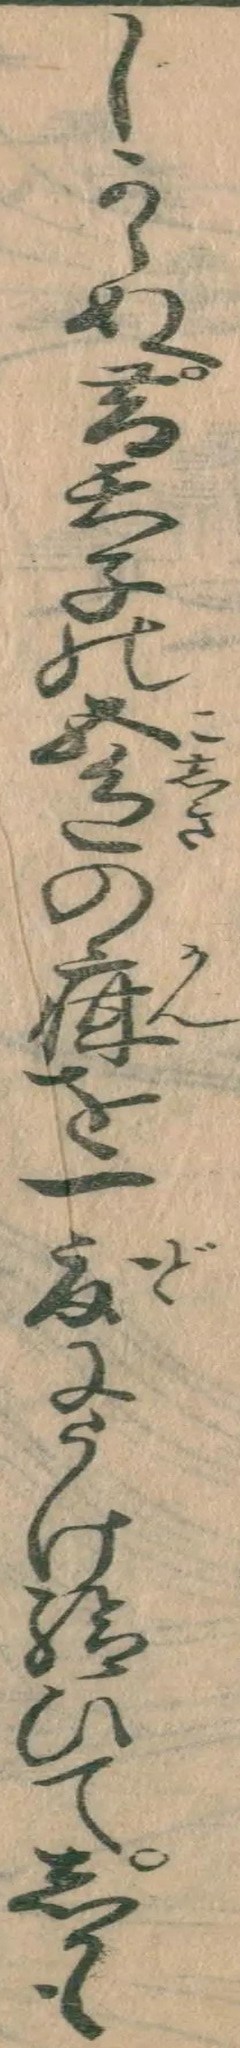しからぬ。昔天子の五色の疳を一度にうけ給ひて。しかも
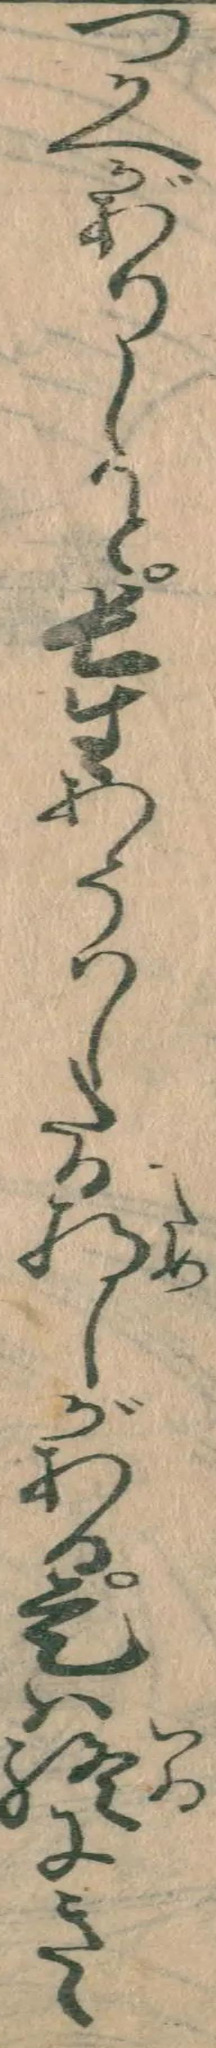つかへがありしかと。長生あそはしたる例しがある。是は終にきゝ
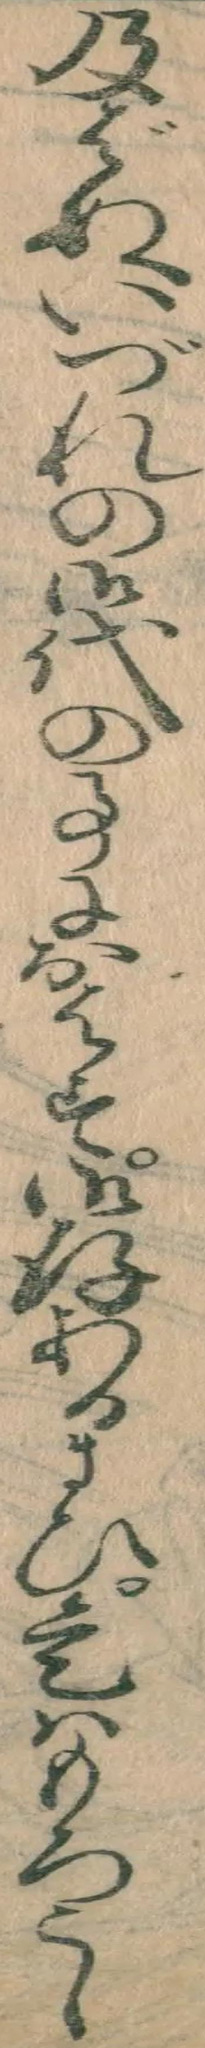及ばぬいづれの御代の事におはす。御存あるまひ。是はもろこし
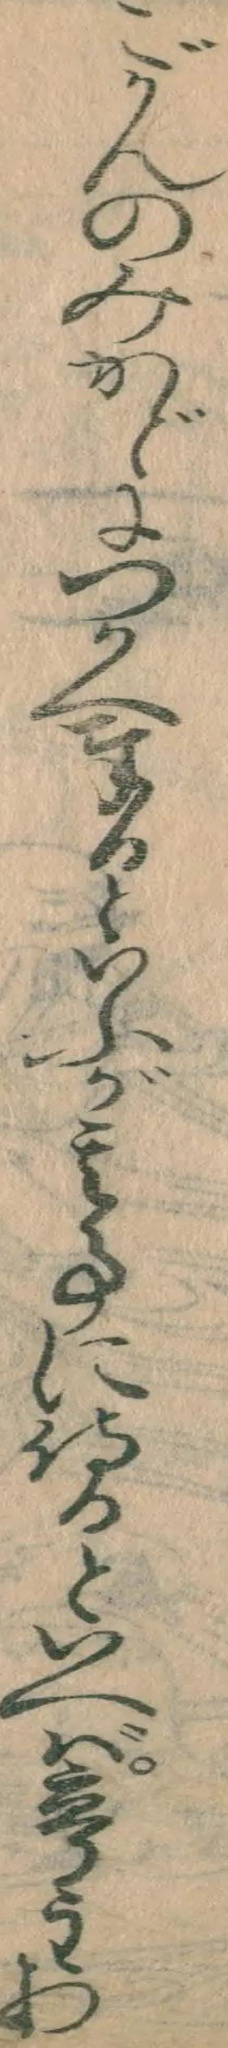ごかんのみかどにつかへ奉るといふが其事に侍るといへば。亭主あ
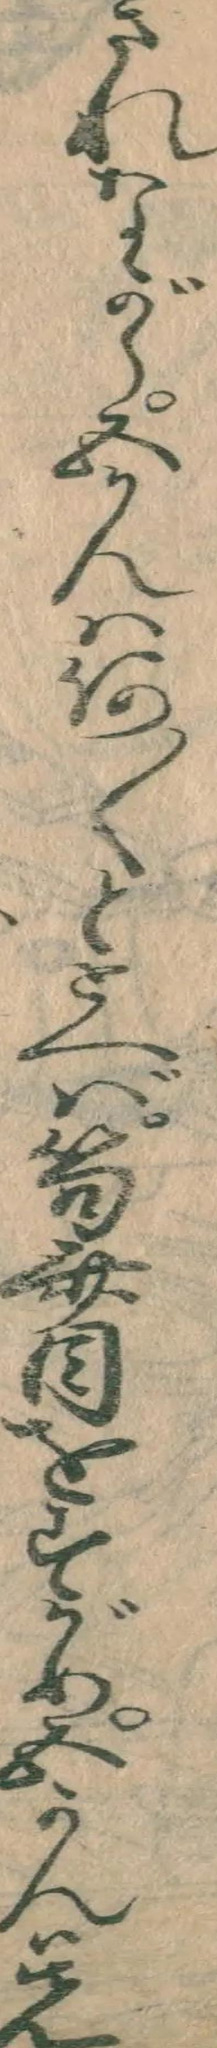きれながら。五かんは何々ととへば。筍斎目をすがめ。五かんは先
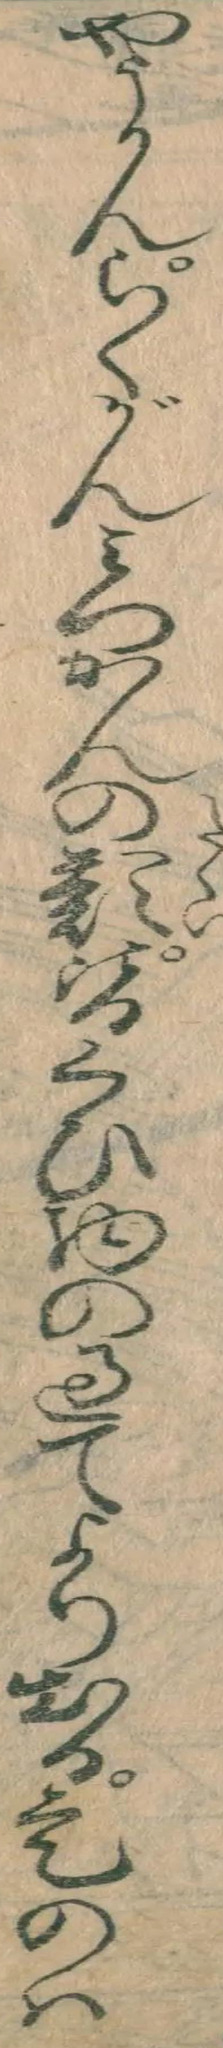やうかん。らくがんみつかんの類。皆くひ物の過てより出る。是のは
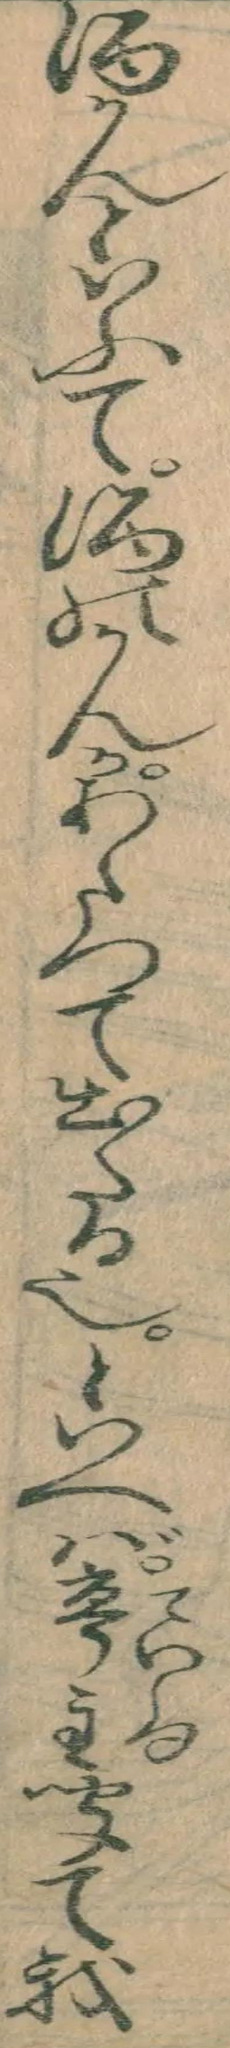酒かんといふて。酒のかんか。あたつて出たる也。といへば。亭主聞て我

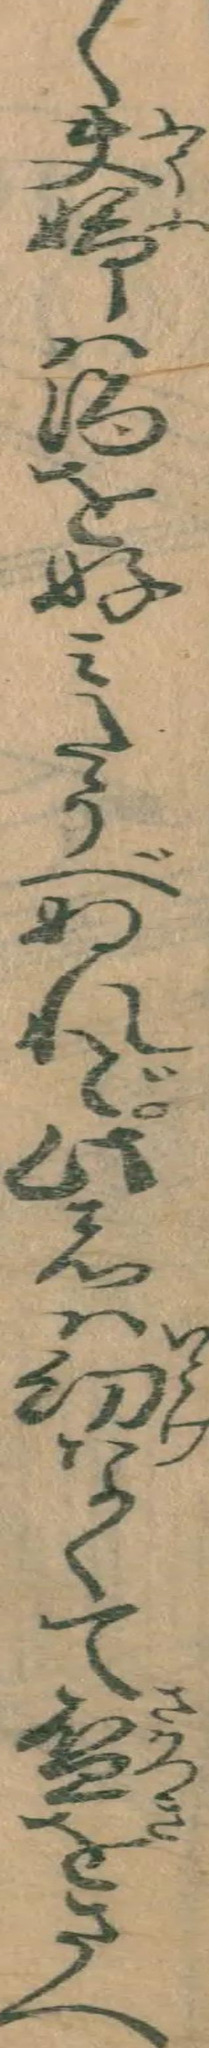々夫婦は酒を好みたうべぬれど。此者は幼なくて杯をさへ
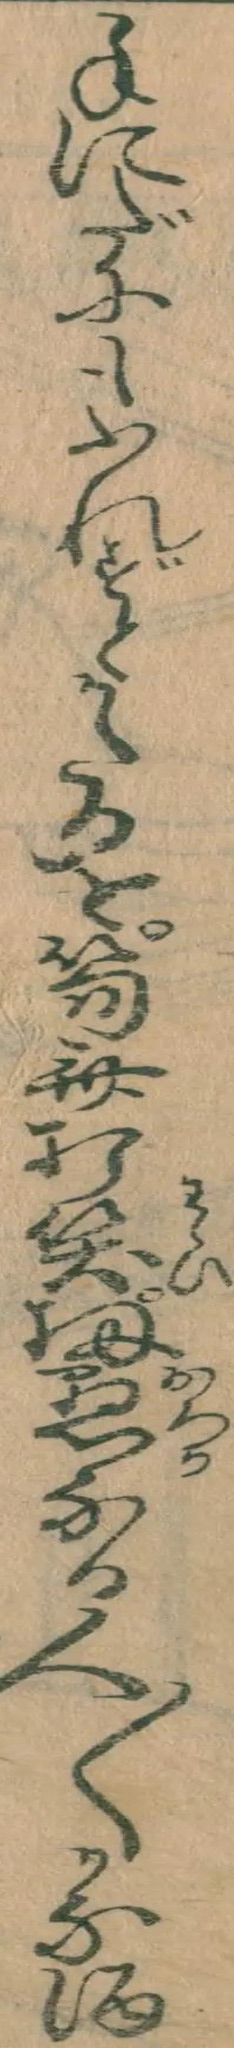手にだにもふれずとかたるを。筍斎打笑。扨愚なる人々かな酒
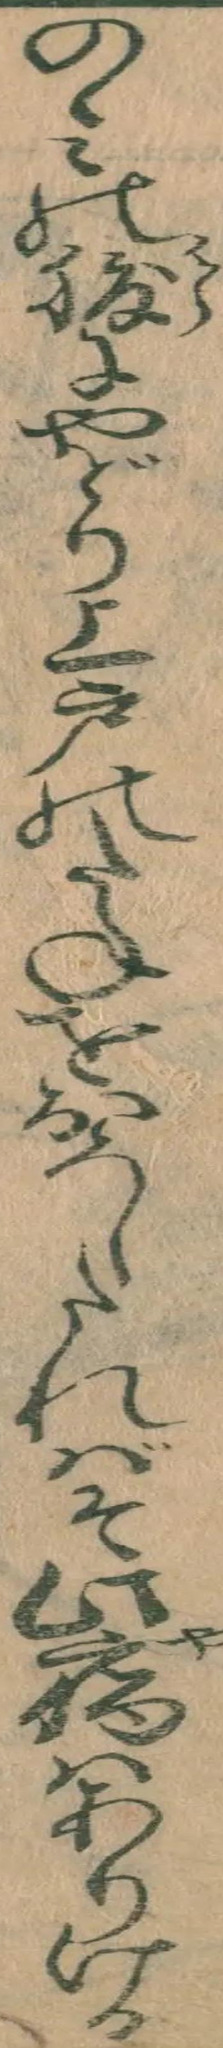のみの腹にやどり上戸のたねをおろしたればそ此病はありける
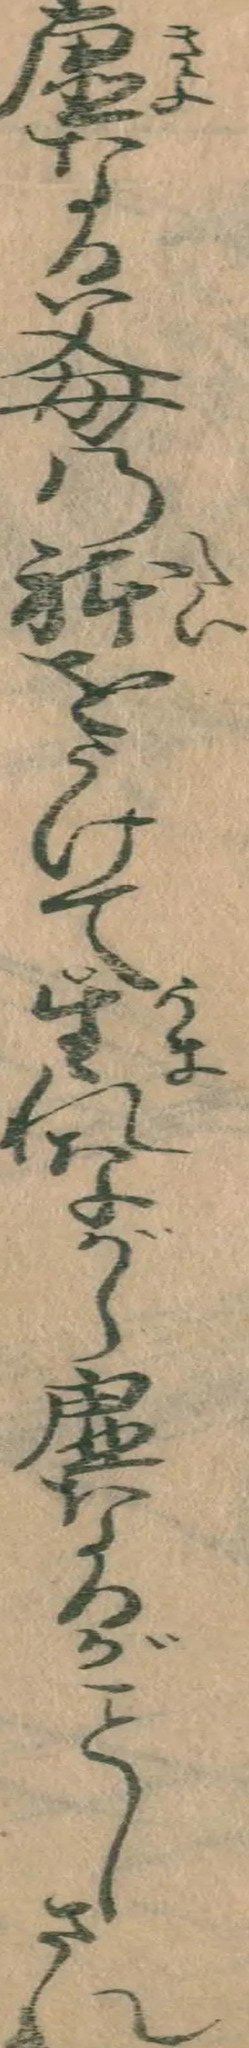虚なる父母の体をうけて。生れながら虚なるがことしされ
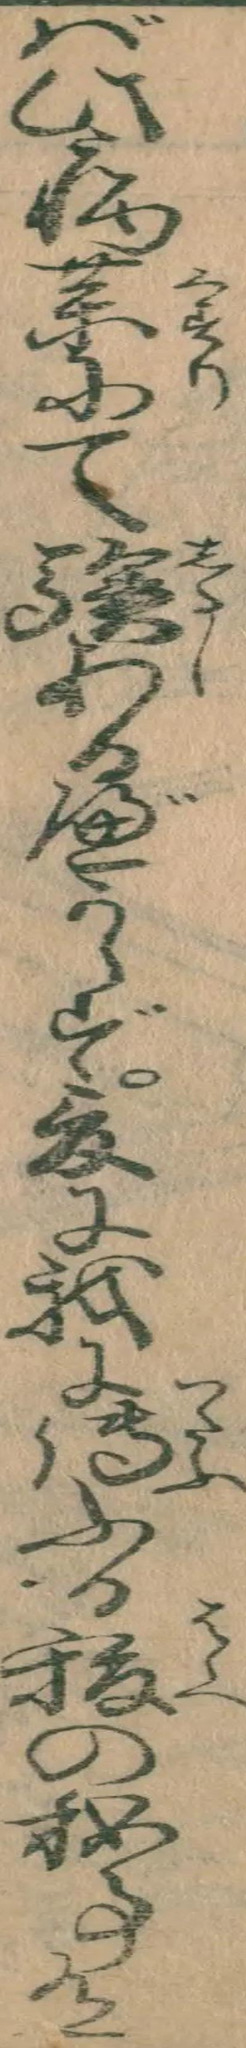ば此病薬にて験あるべからず。爰に我に伝ふる祓の秘事有
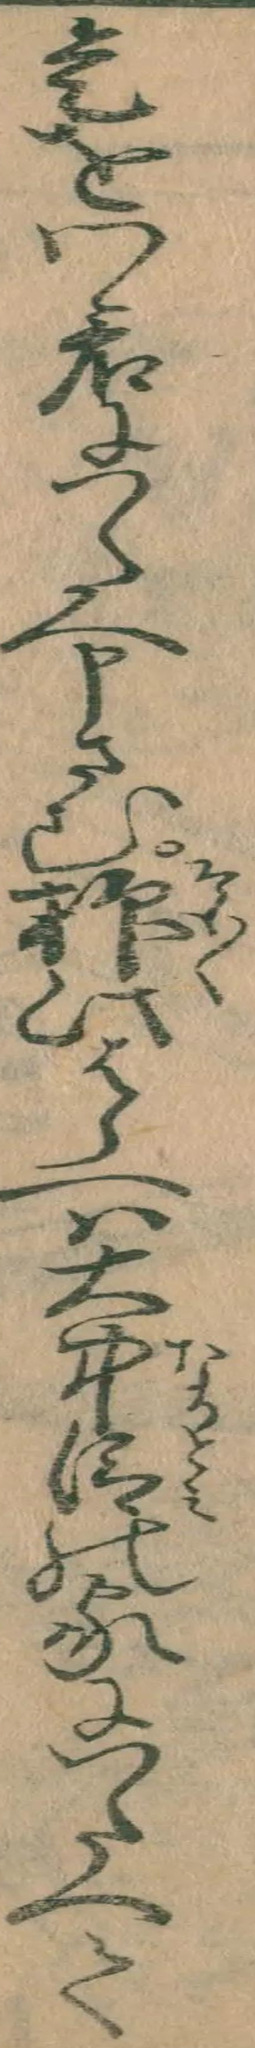是をは君につたへ申さむ。抑此はらへは大中臣の家につたへて
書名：新竹斎 5巻
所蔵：国立国会図書館 National Diet Library, JAPAN
